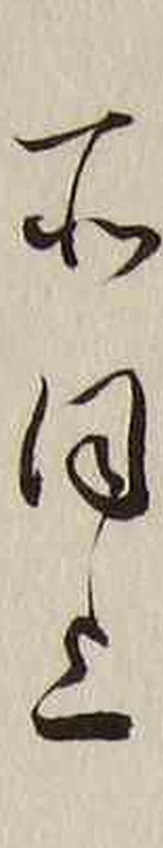所同上

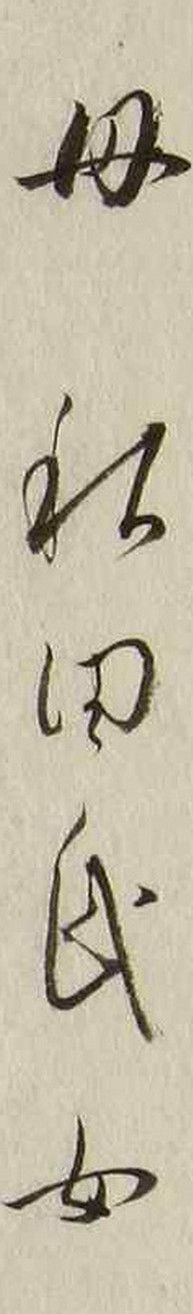母秋田氏女
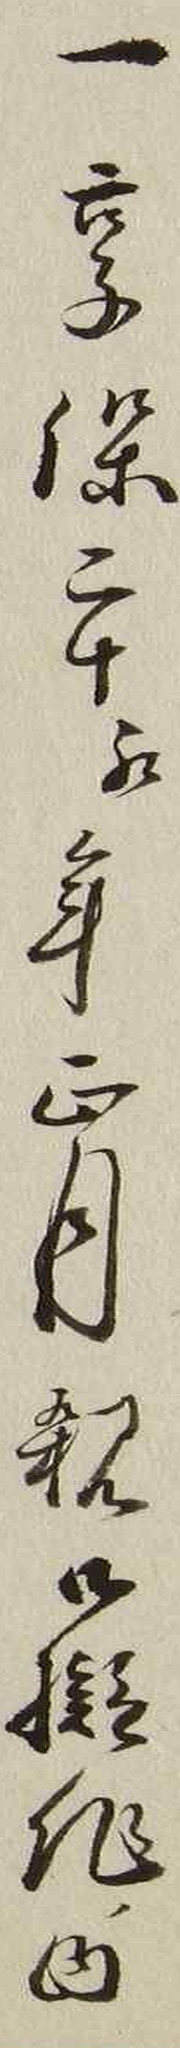一享保二十卯年正月親御擬作の内
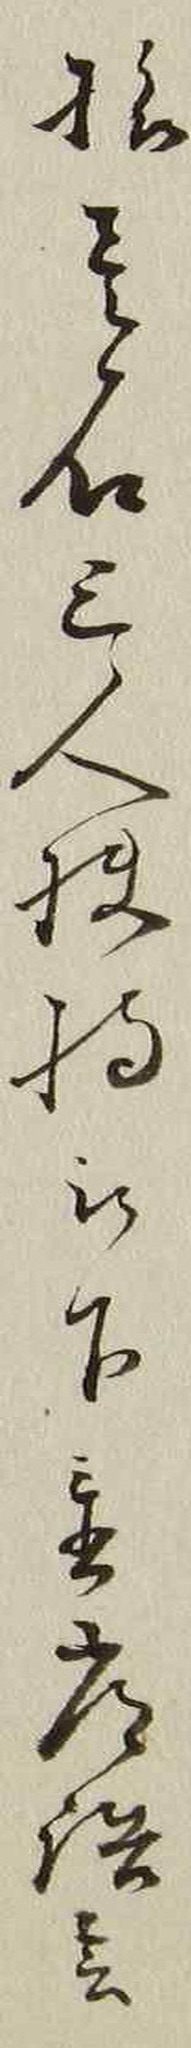拾壱石三人扶持被下置常詰会
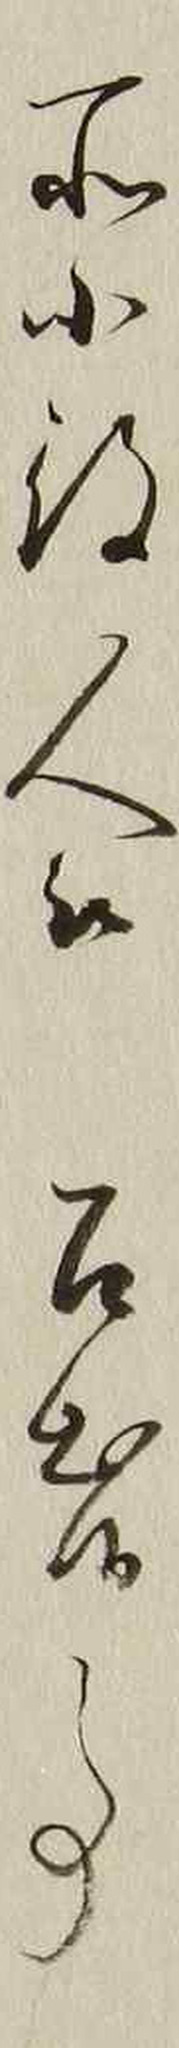所小役人被召出候事
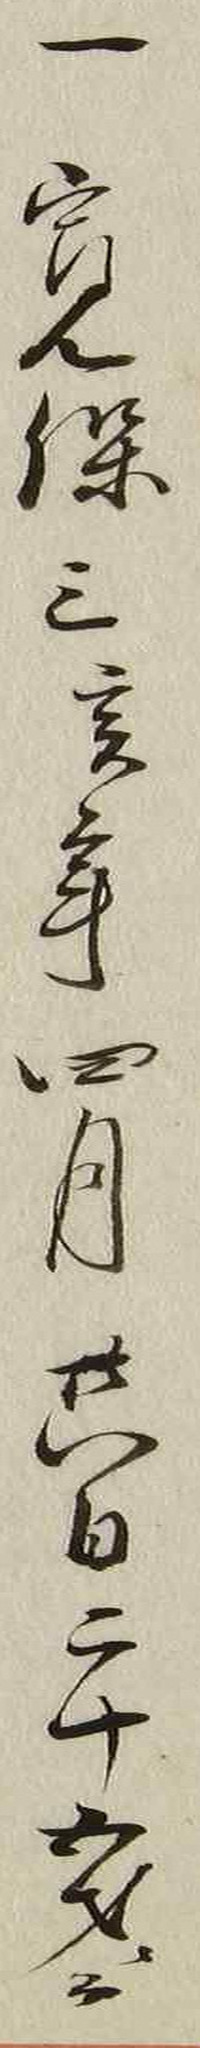一寛保三亥年四月廿八日二十五才に而
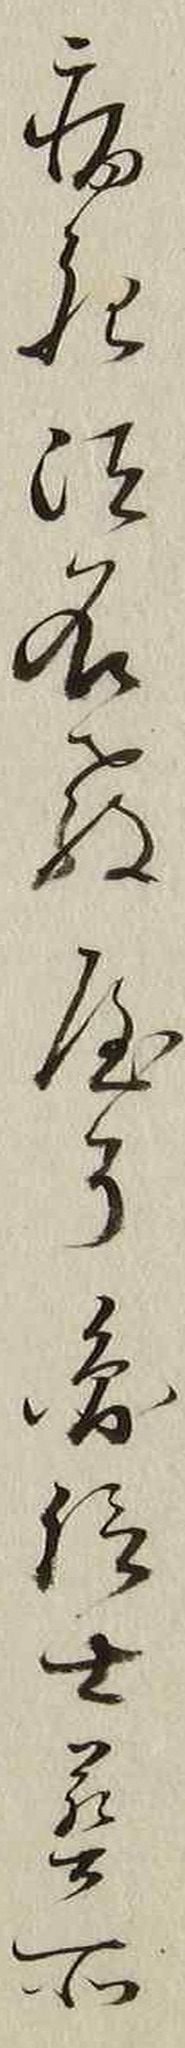病死法名教屋了円信士葬所
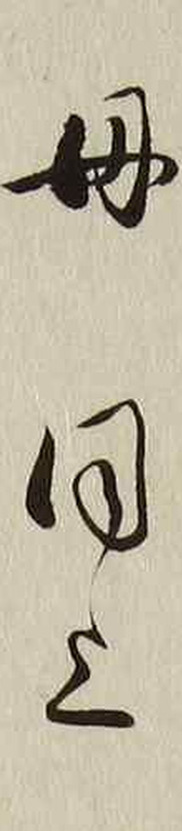母同上
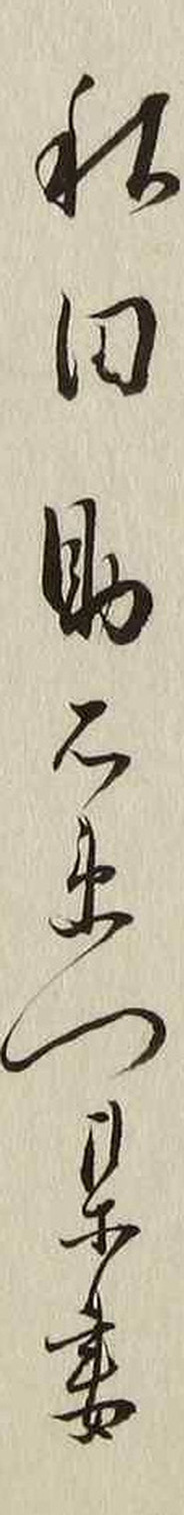女秋田助右衛門某妻
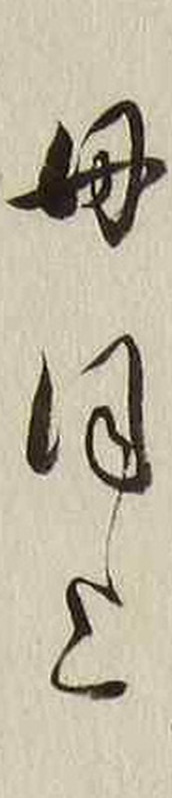母同上
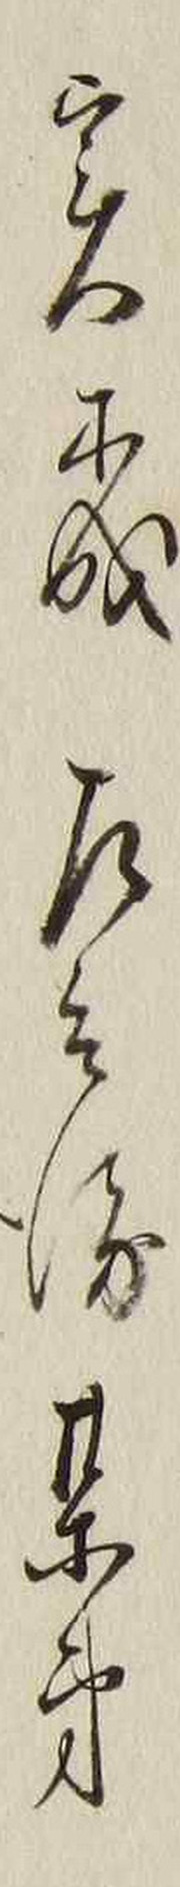実森左兵衛某弟

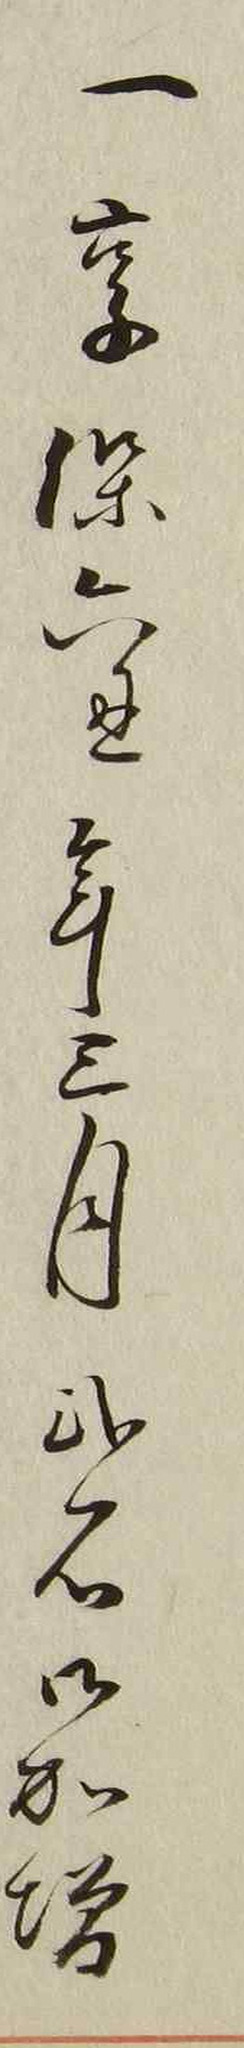一享保六丑年三月弐石御加増
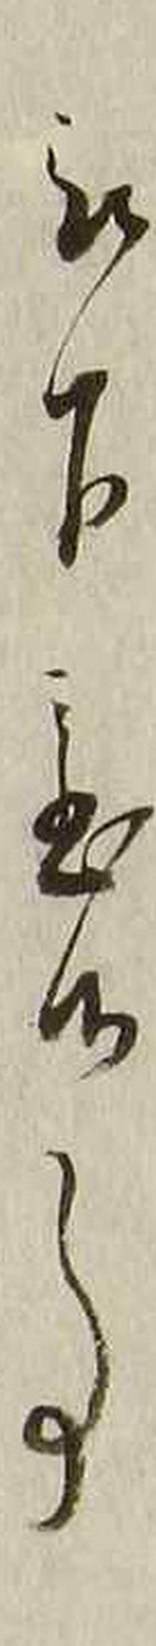被下置候事
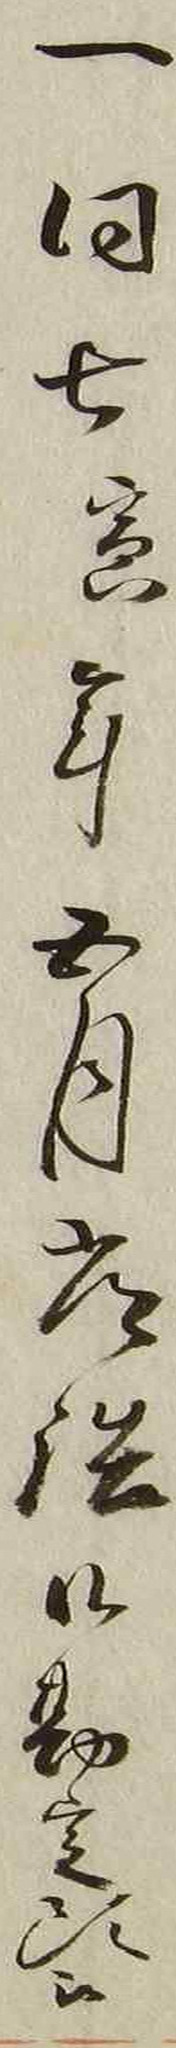一同七寅年五月常詰御勘定頭被
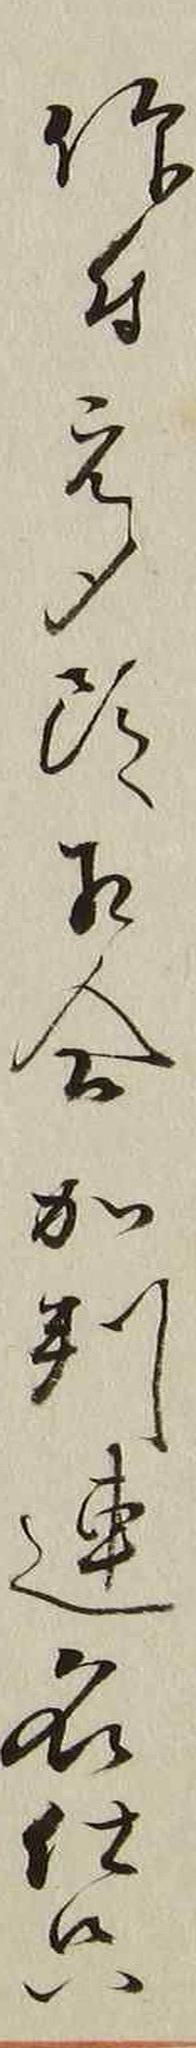仰付元〆頭相合加判連名仕只
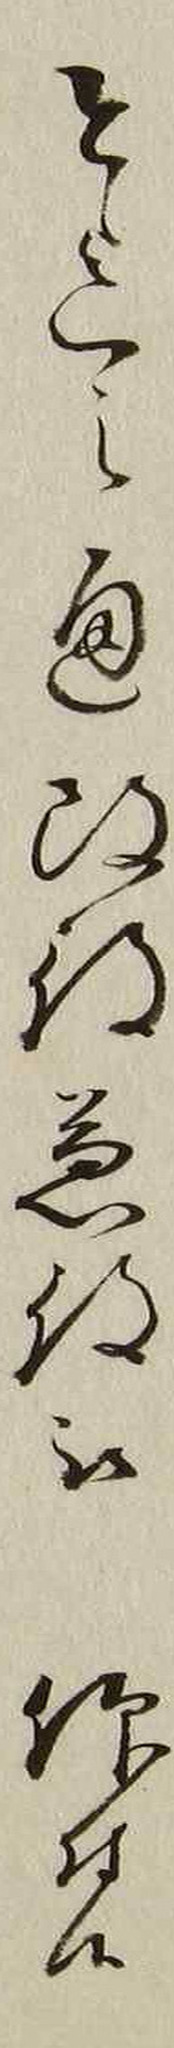今迄之通改役兼役被仰付候
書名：諸士系譜　巻之158　ね之部2
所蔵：会津若松市立会津図書館
